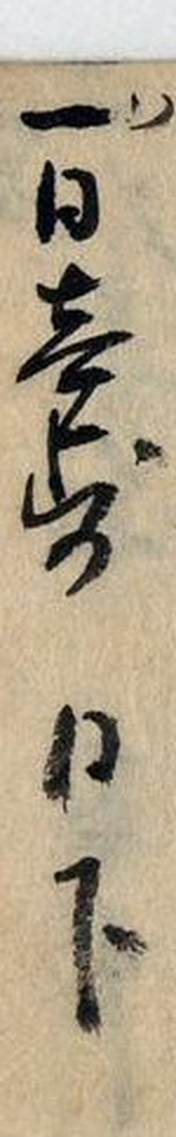一同壱歩同下

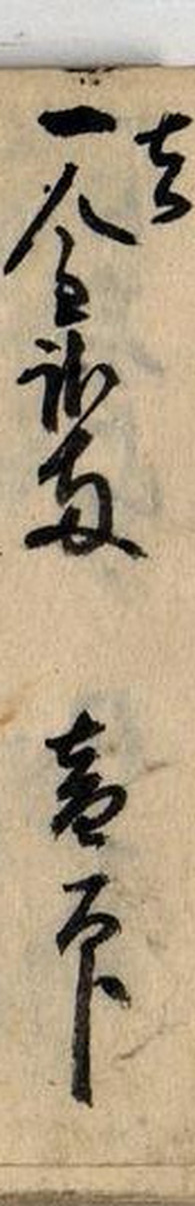一金弐両印
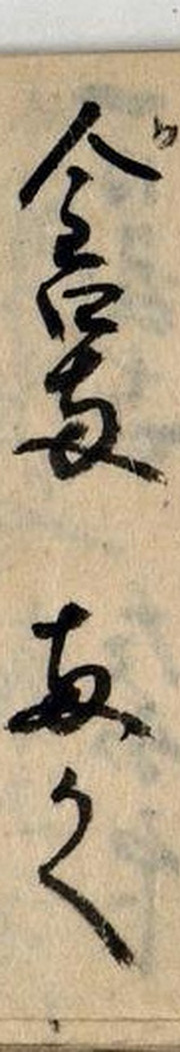金四両両かへ
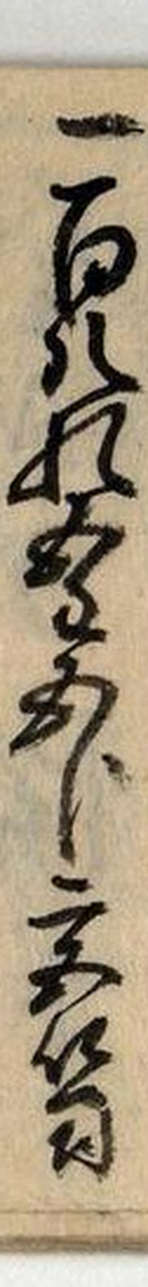一百弐拾五匁五歩宮笥
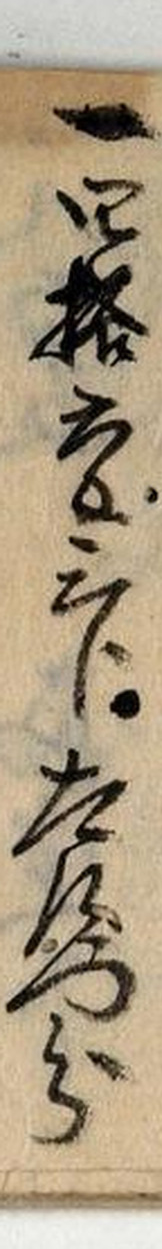一四拾六匁三歩太左衛門分
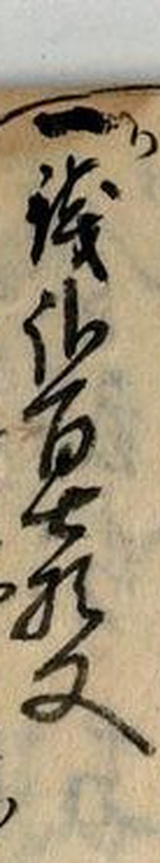一銭弐百七拾文
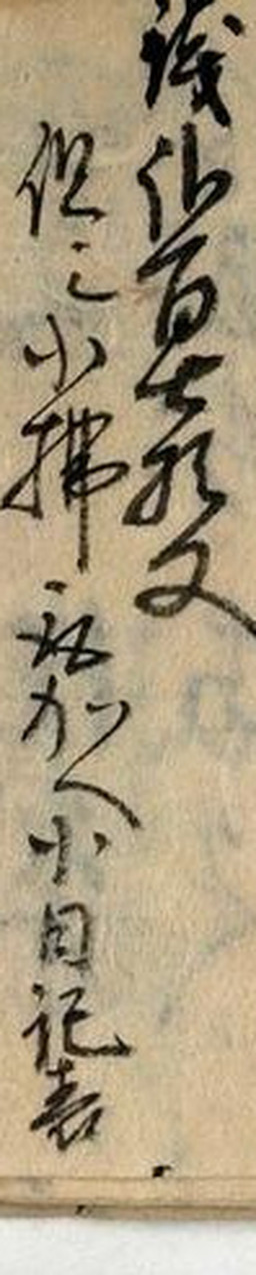但シ小払取かへ小日記表
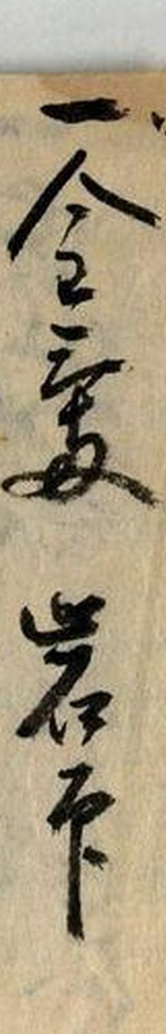一金三両岩印
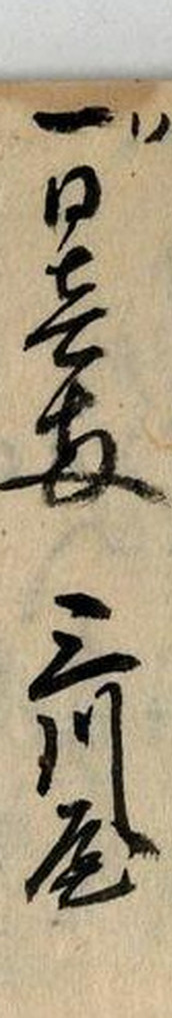一同壱両三川屋
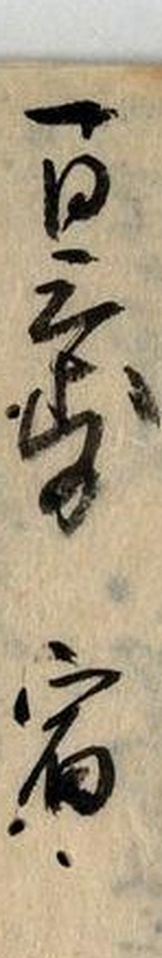一同三歩宿
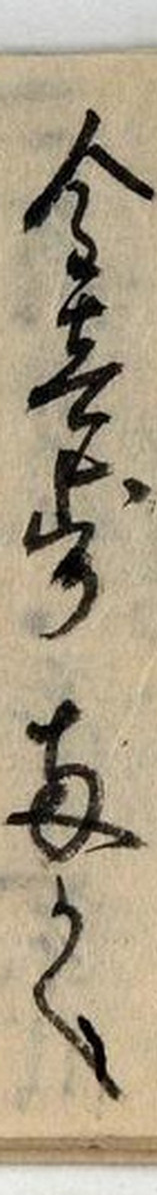金壱歩両かへ
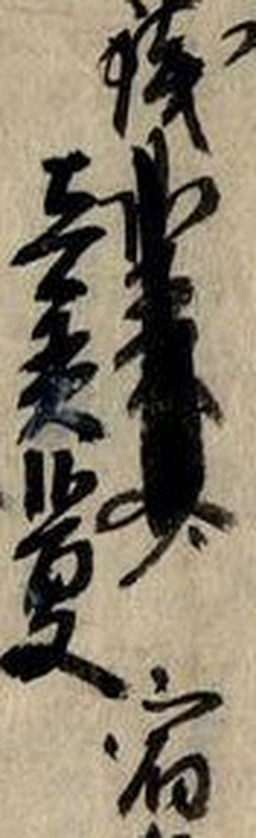壱貫弐百文
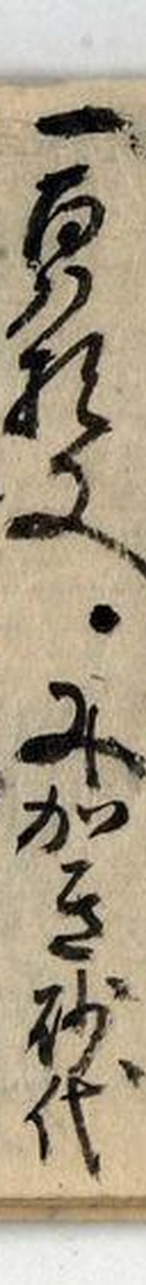一百八拾文みかき砂代
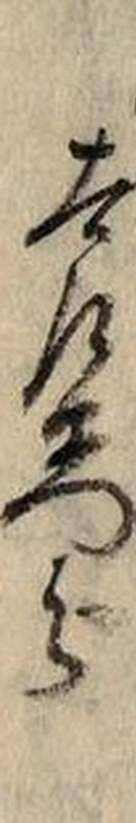太左衛門分

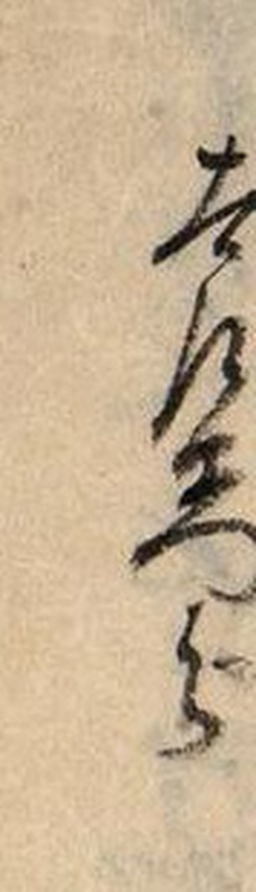太左衛門分
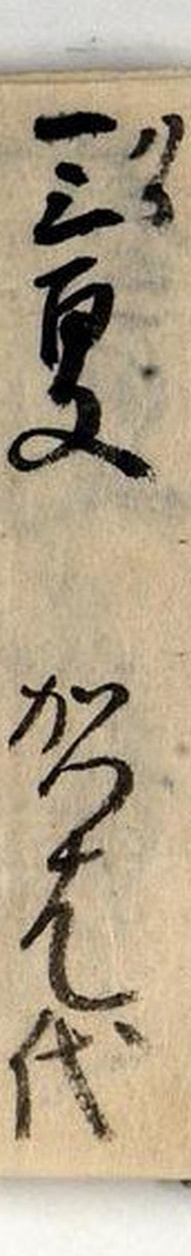一三百文かつは代
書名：道中小遣留帳（旅）
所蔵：福井県文書館 Fukui Prefectural Archives
